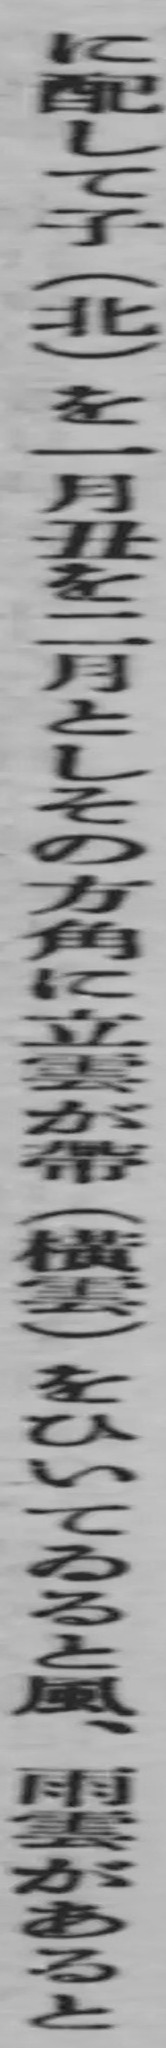に配して子(北)を一月丑を二月としてその方角に立雲が帯(横雲)をひいてゐると風、雨雲があると
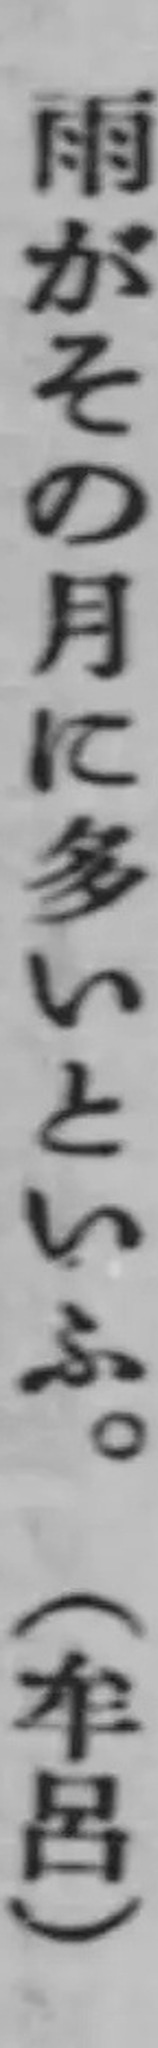雨がその月に多いといふ。(牟呂)
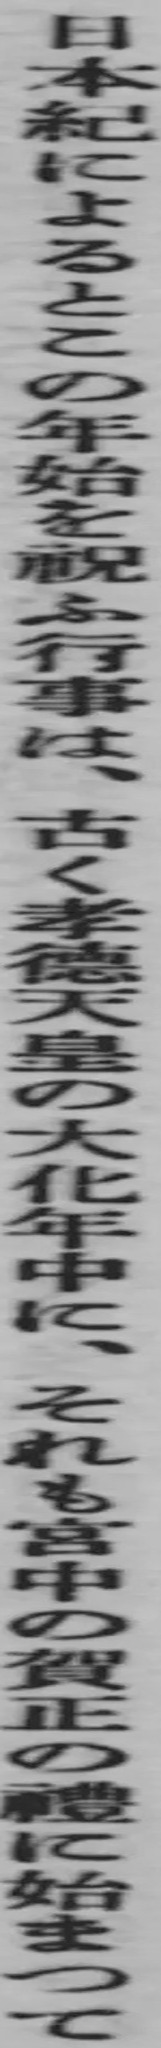日本紀によるとこの年始を祝ふ行事は、古く孝德天皇の大化年中に、それも宮中の賀正の禮に始まつて
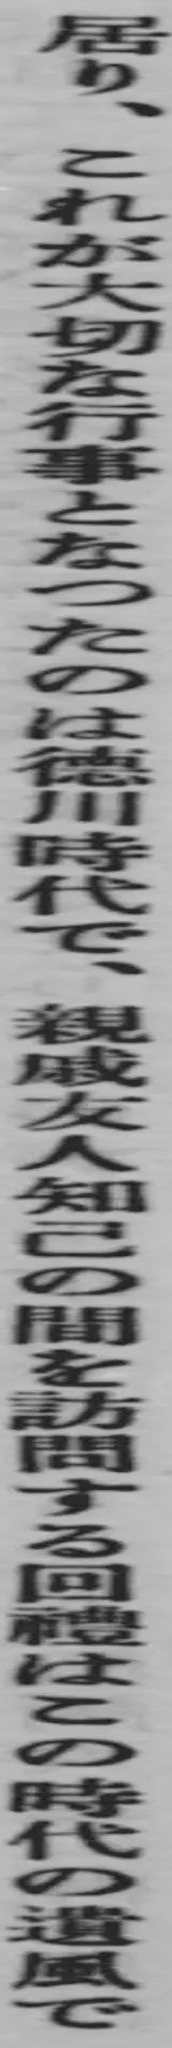居り、これが大切な行事となつたのは徳川時代で、親戚友人知己の間を訪問する回禮はこの時代の遺風で
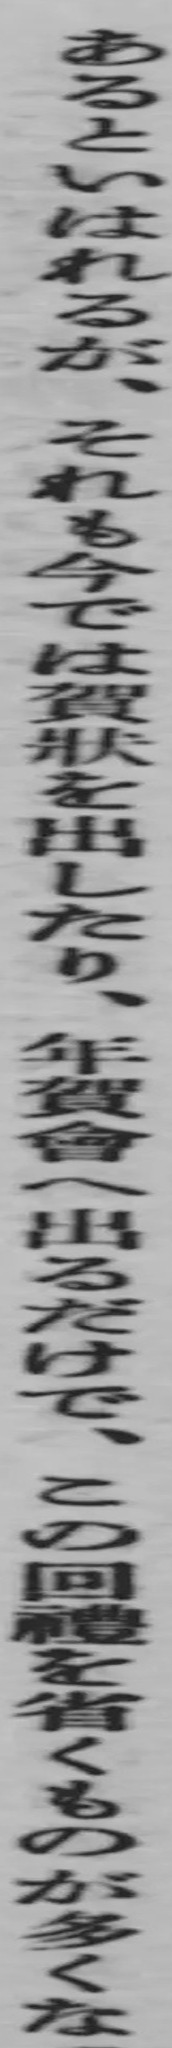あるといはれるが、それも今では賀狀を出したり、年賀會へ出るだけで、この回禮を省くものが多くなつ
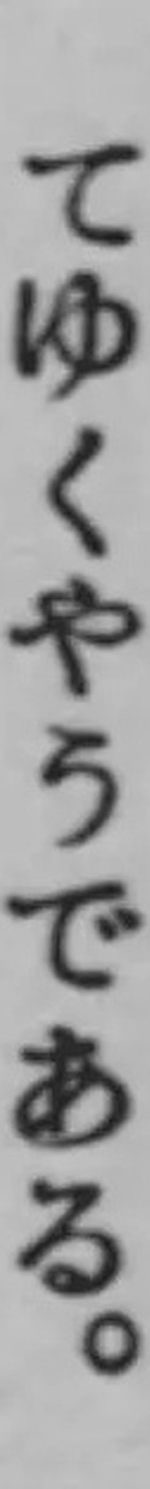てゆくやうである。
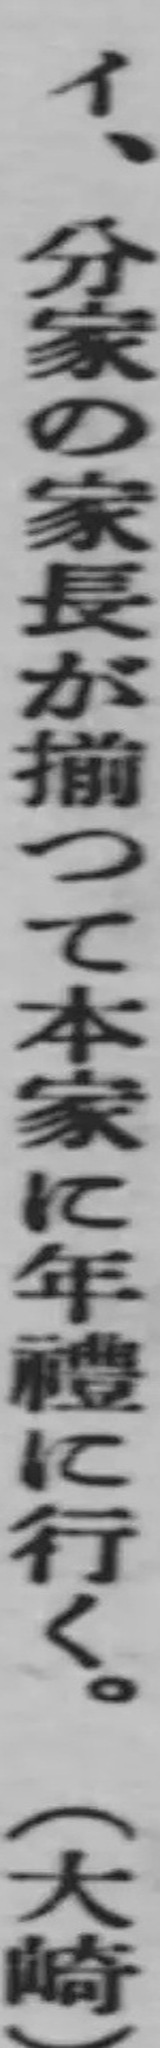イ、分家の家長が揃つて本家に年禮に行く。(大崎)
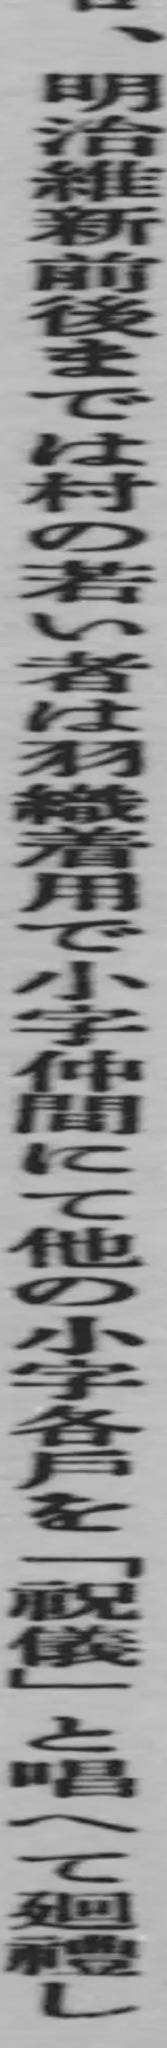ロ、明治維新前後までは村の若い者は羽織着用で小字仲間にて他の小字各戸を「祝儀」と唱へて廻禮し
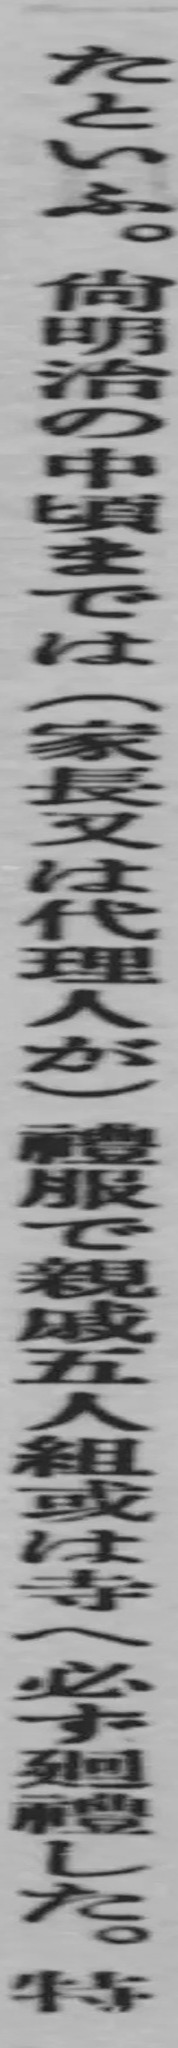たといふ。尚明治の中頃までは(家長又は代理人が)禮服で親戚五人組或は寺へ必ず廻禮した。特
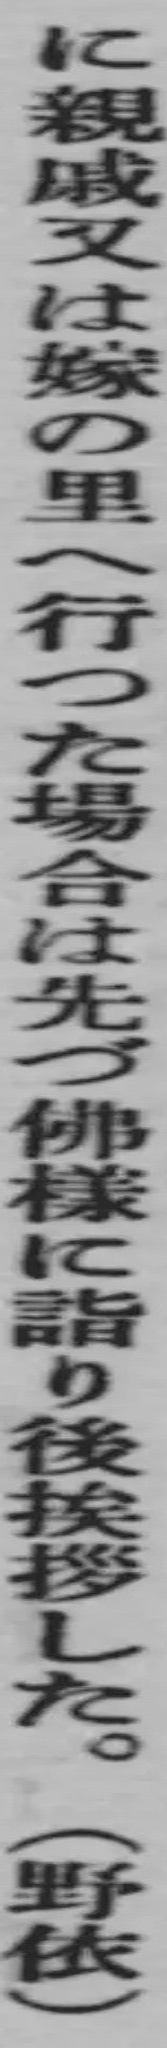に親戚又は嫁の里へ行つた場合は先づ佛様に詣り後挨拶した。(野依)
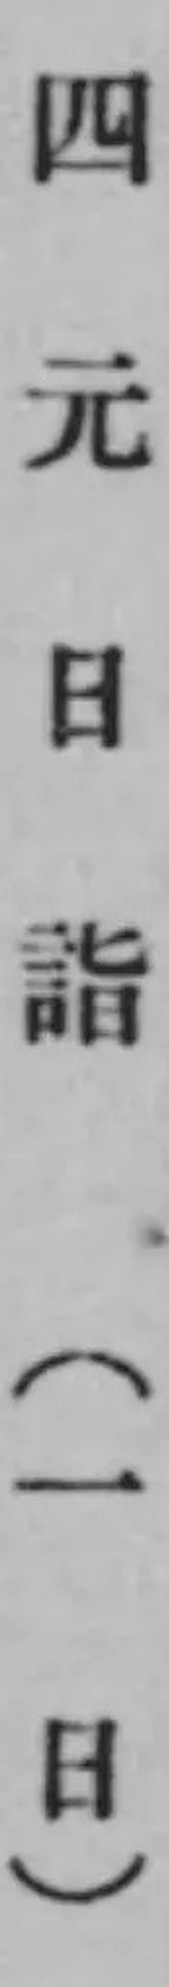四元旦詣(一日)
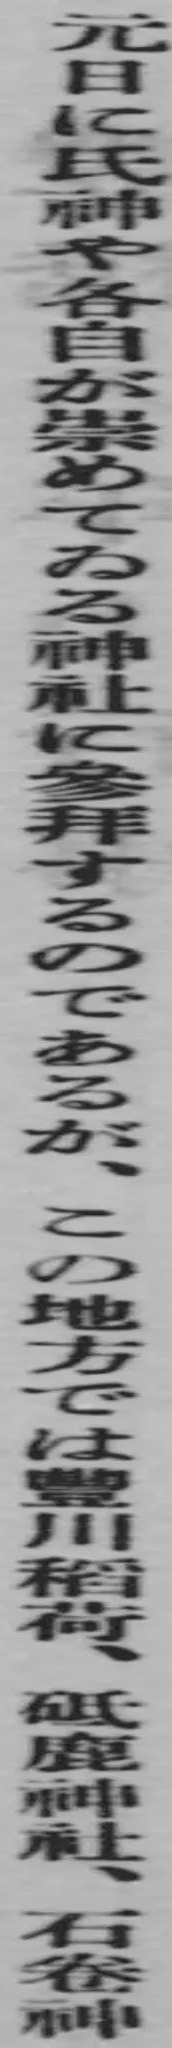元日に氏神や各自が崇めてゐる神社に參拜するのであるが、この地方では豐川稲荷、砥鹿神社、石卷神
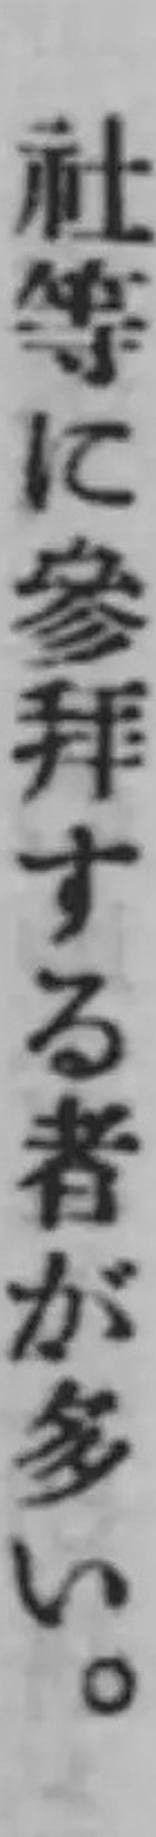社等に參拜する者が多い。
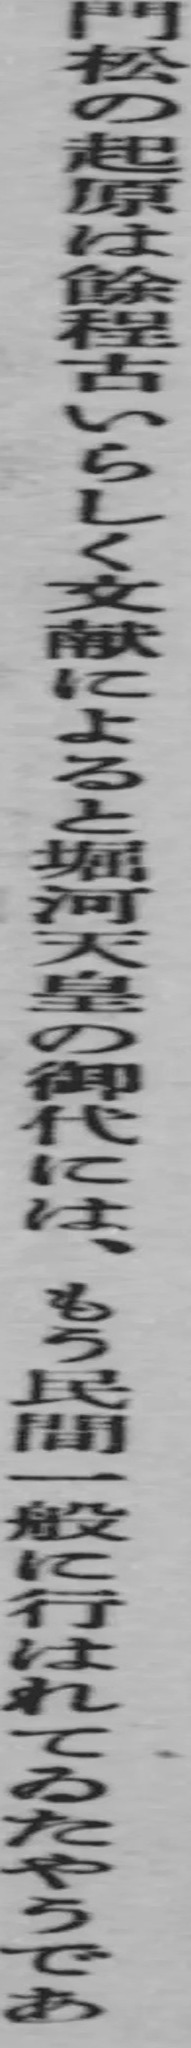門松の起原は餘程古いらしく文献によると堀河天皇の御代には、もう民間一般に行はれてゐたやうであ
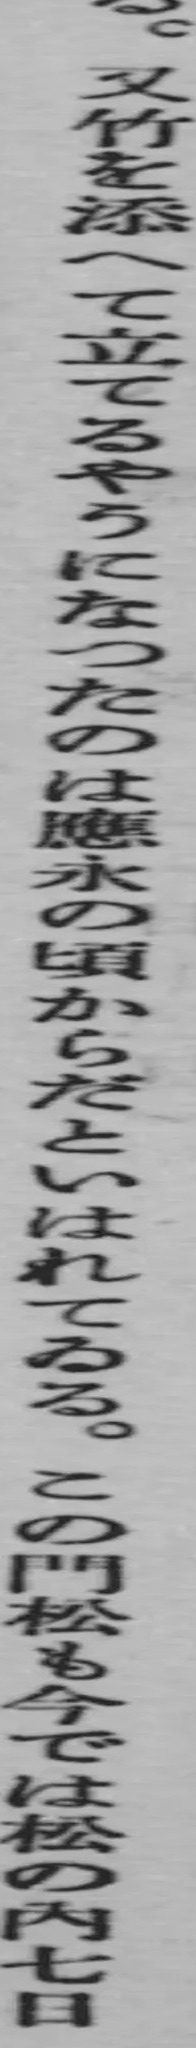る。又竹を添へて立てるやうになつたのは應永の頃からだといはれてゐる。この門松も今では松の内七日
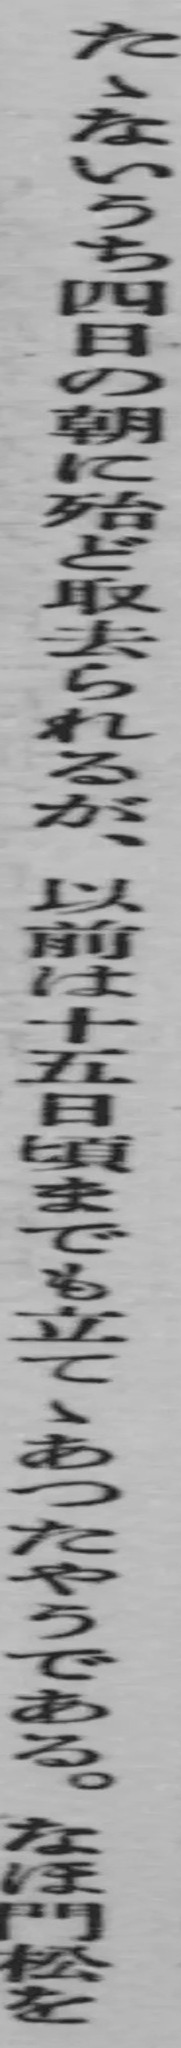たゝないうち四日の朝に殆ど取去られるが、以前は十五日頃までも立てゝあつたやうである。なほ門松を
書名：豊橋の年中行事
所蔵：国立国会図書館 National Diet Library, JAPAN
